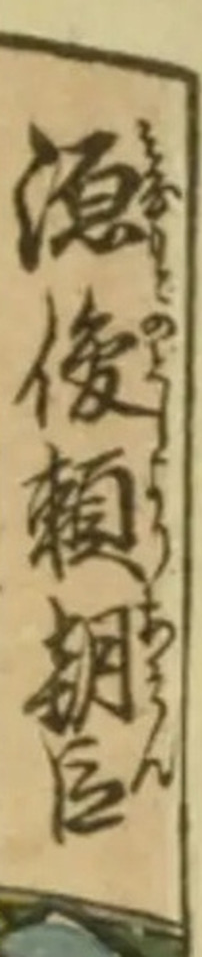源俊頼朝臣
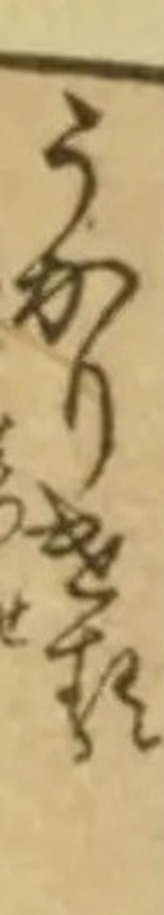うかりける
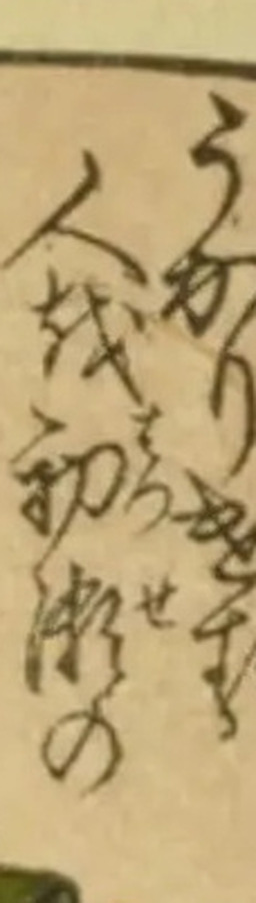人を初瀬の
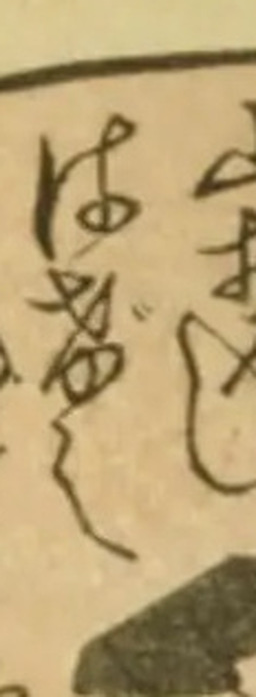はげし
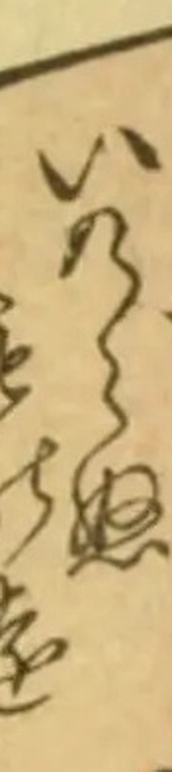いのらぬ
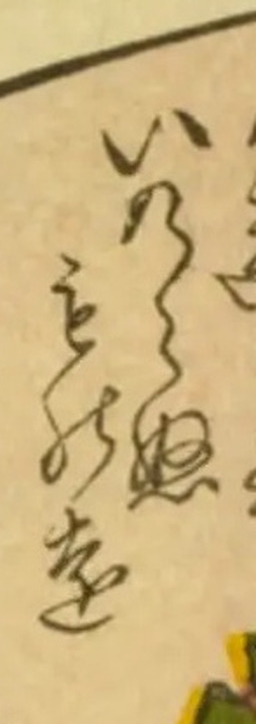ものを
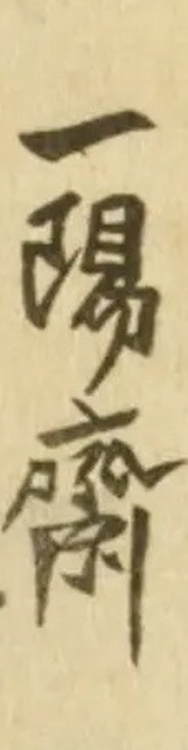一陽斎
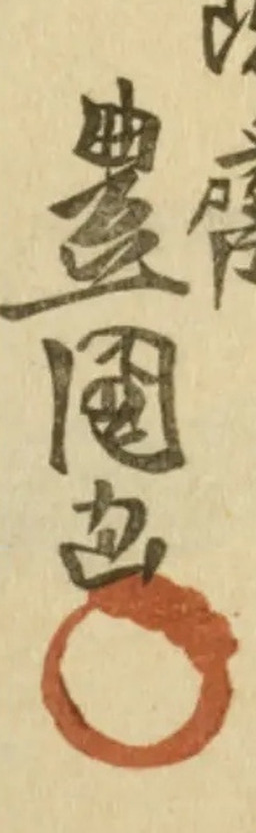豊国画
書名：七十四番　源俊頼朝臣
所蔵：国立国会図書館 National Diet Library, JAPAN
